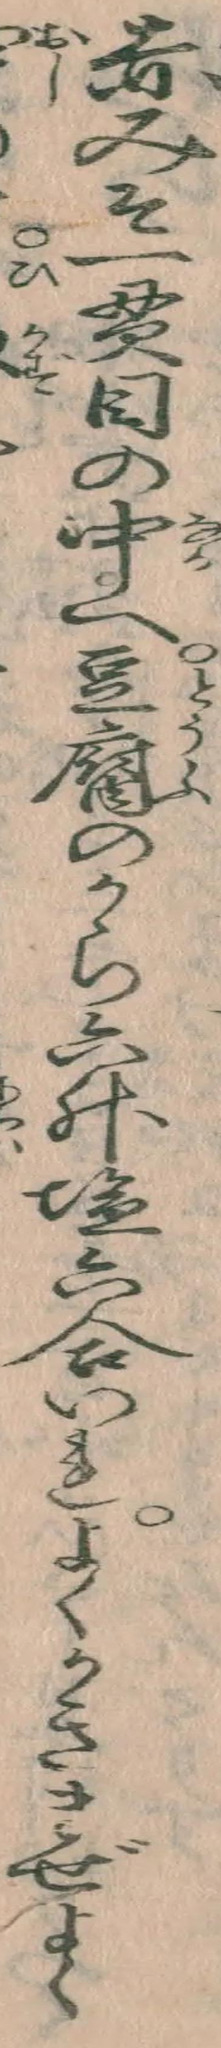赤みそ一貫目の中へ。豆腐のから六升塩六合いれ。よくかきまぜよく
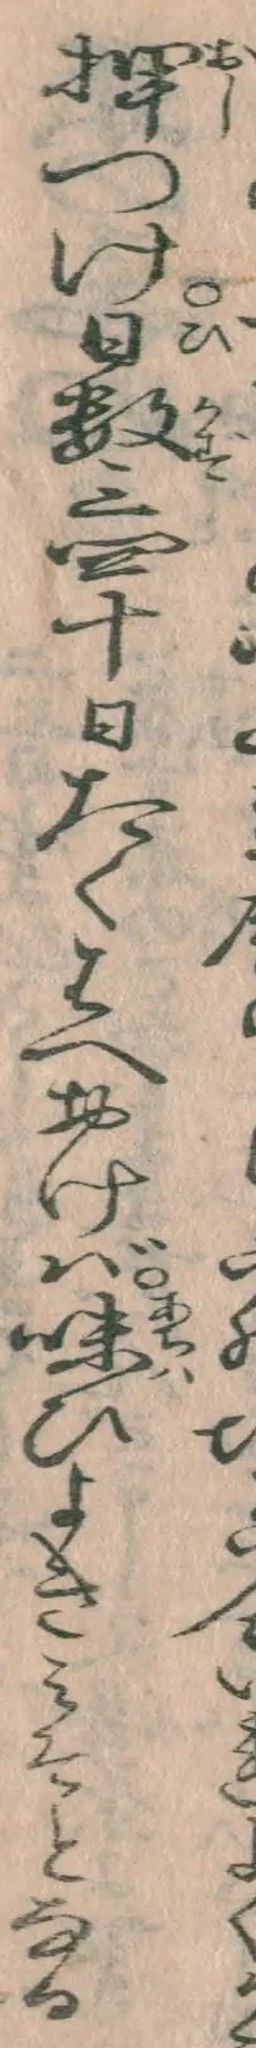押つけ。日数三四十日たくはへおけば。味ひよきみそとなる
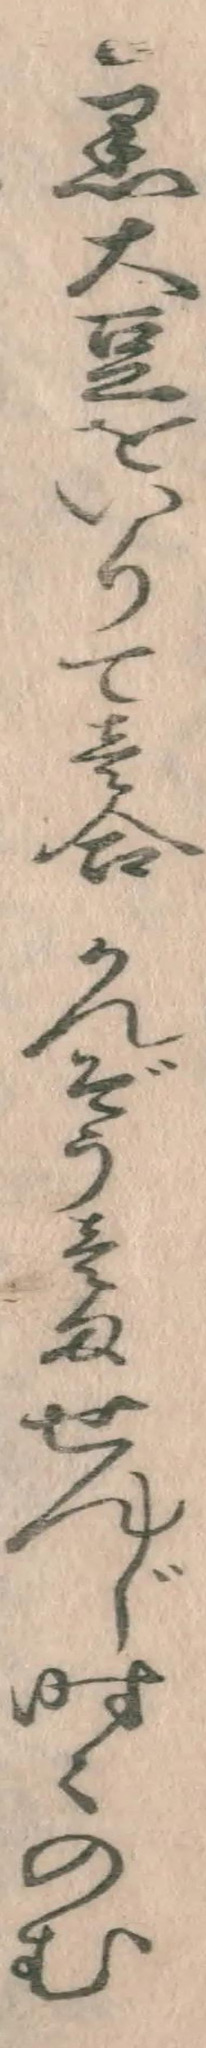◦黒大豆をいりて壱合かんぞう壱匁せんじ時々のむ
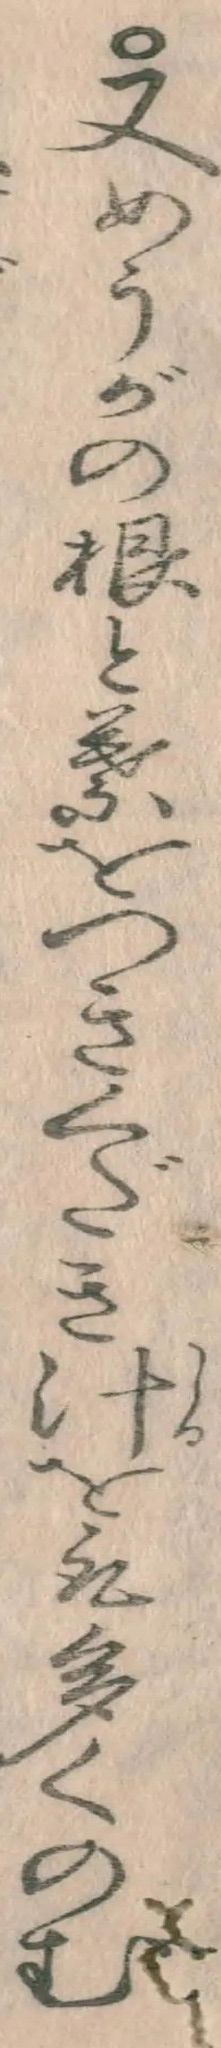◦又めうがの根と葉をつきくだき汁を取多くのむ
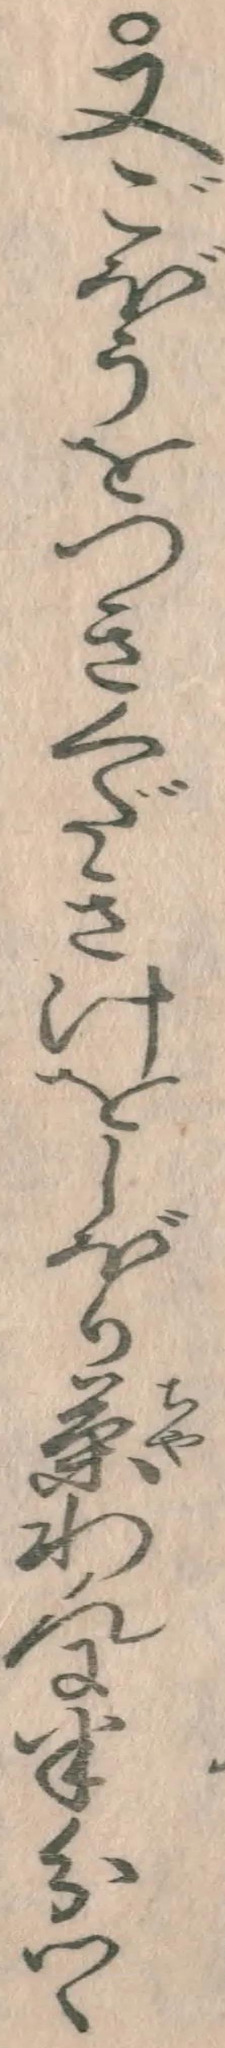◦又ごぼうをつきくだき汁をしぼり茶わんに半分ツヽ
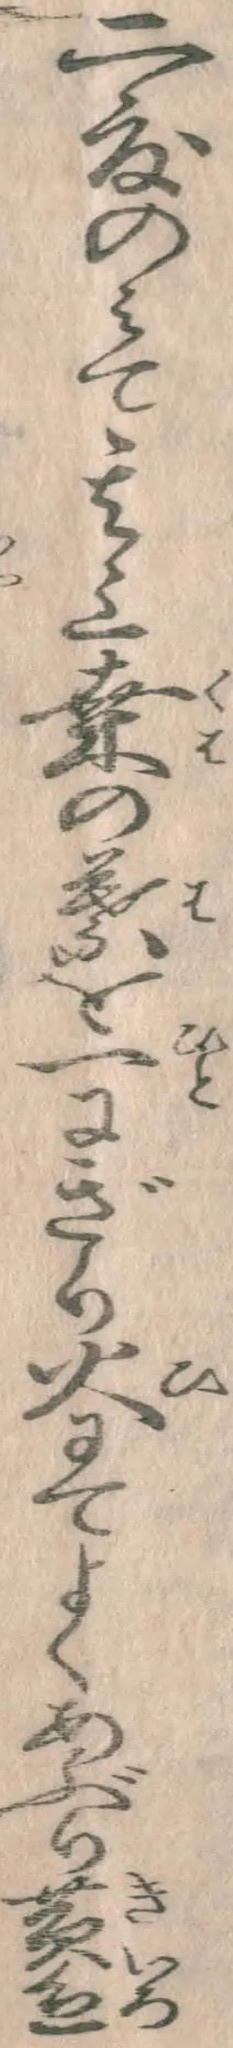二度のみて其上桑の葉を一にぎり火にてよくあぶり黄色
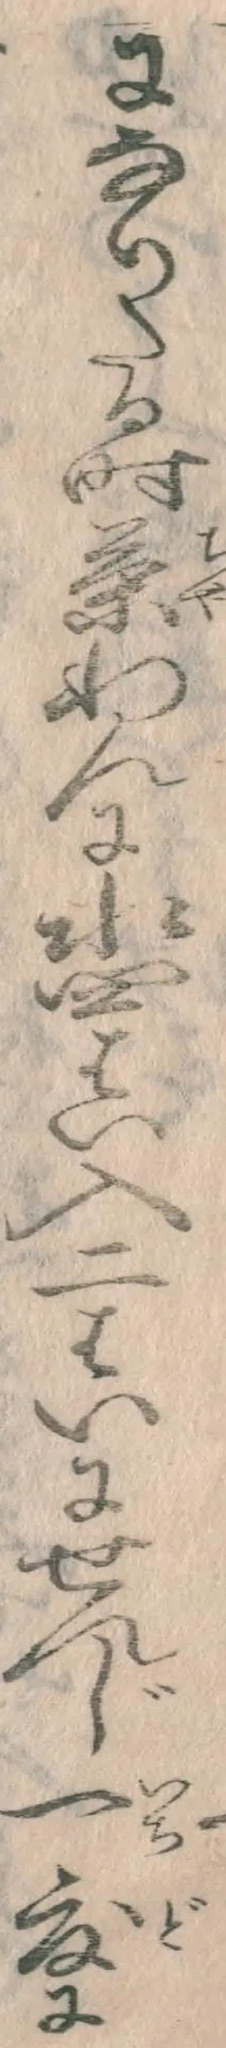になりたる時茶わんに水四はい入二はいにせんじ一度に
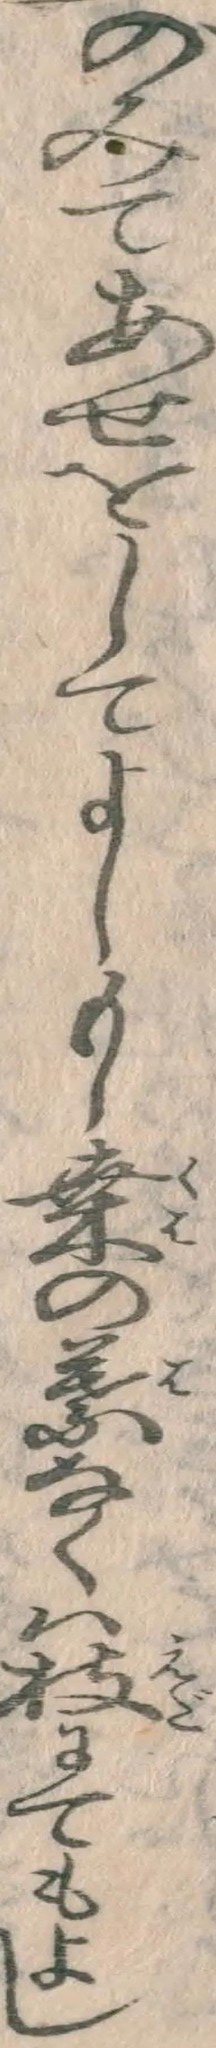のみてあせをしてよしもし桑の葉なくは枝にてもよし
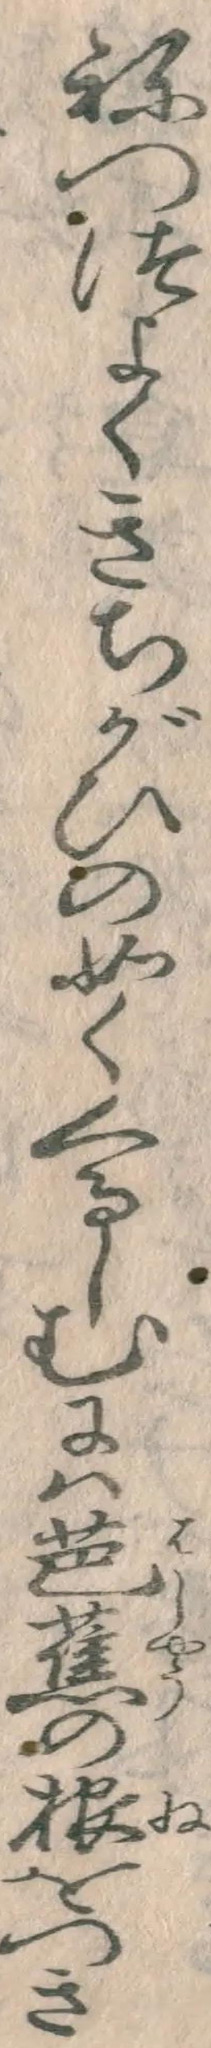ねつつよくきちがひの如くくるしむには芭蕉の根をつき
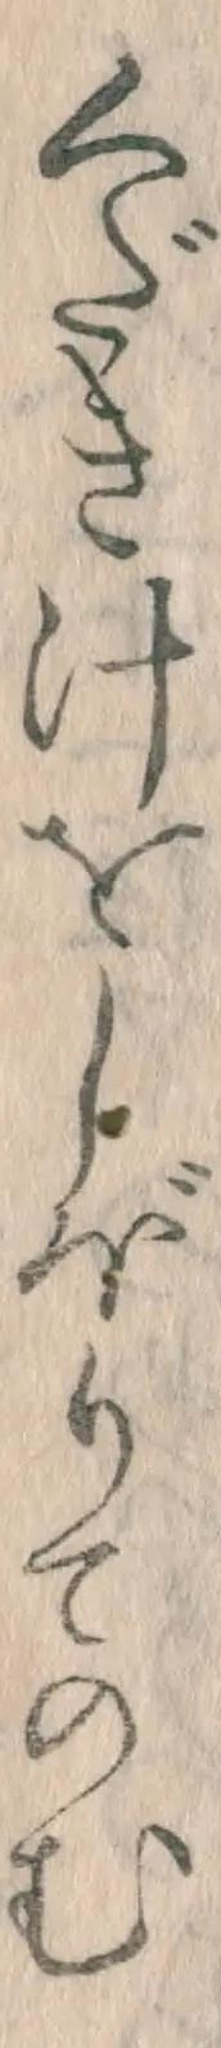くだき汁をしぼりてのむ
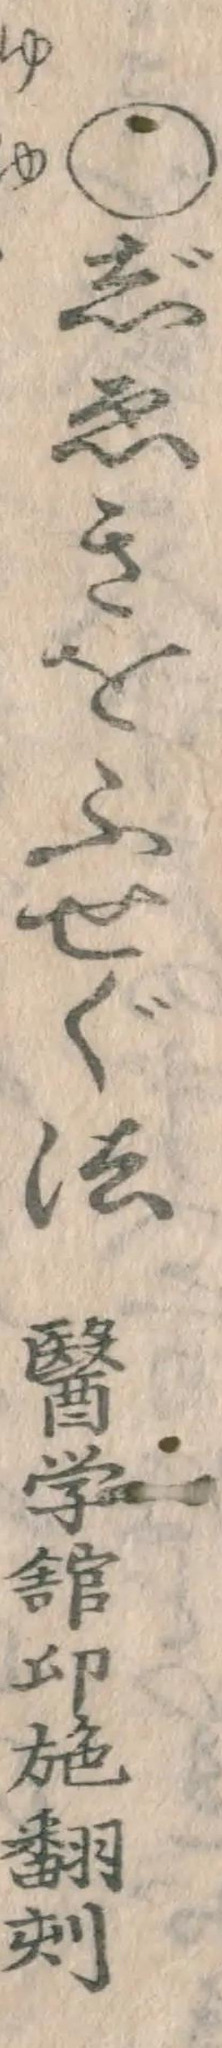◯じゑきをふせぐ法医学館印施翻刻
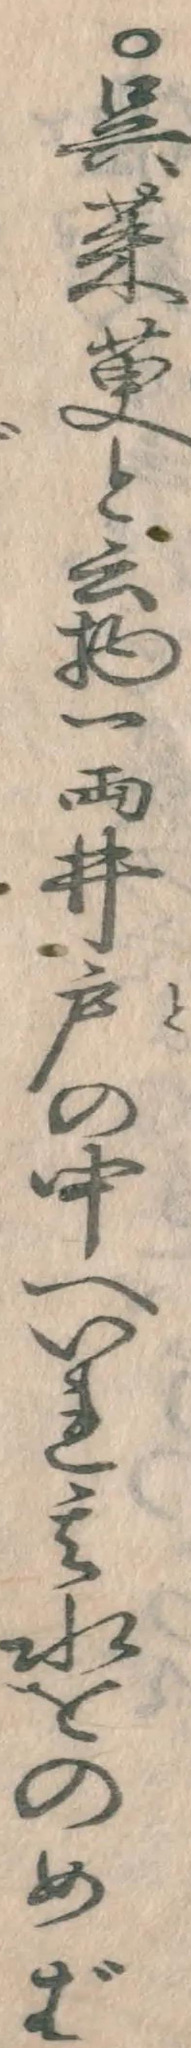◦呉茱萸と云物一両井戸の中へいれ其水をのめば
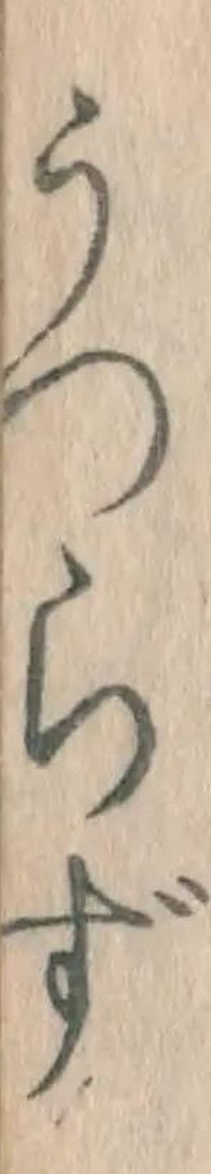うつらず

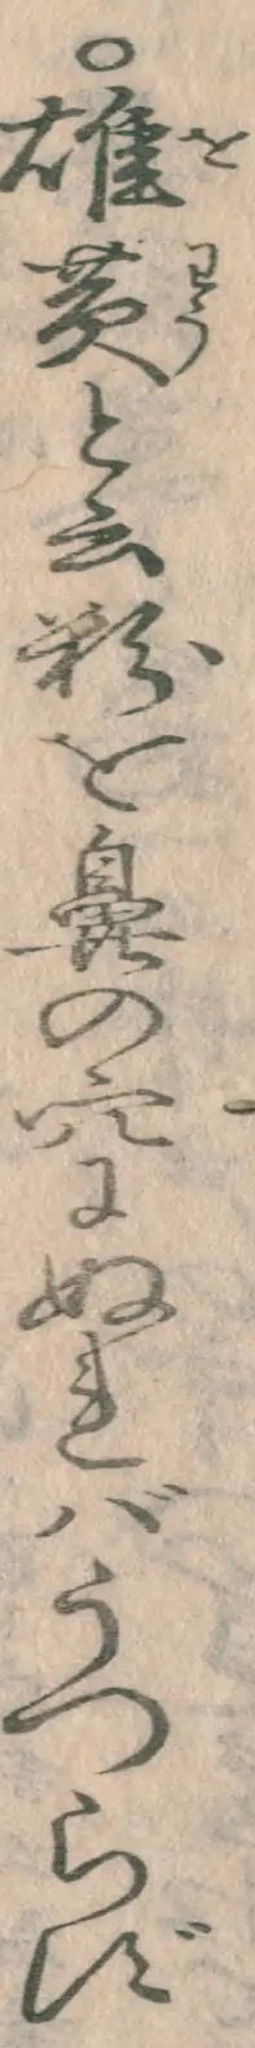◦雄黄と云粉を鼻の穴にぬればうつらず
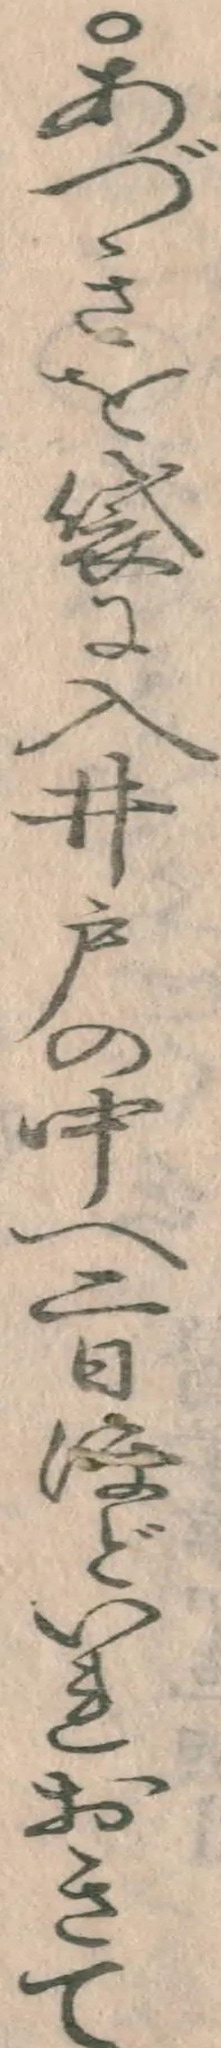◦あづきを袋に入井戸の中へ二日ほどいれおきて
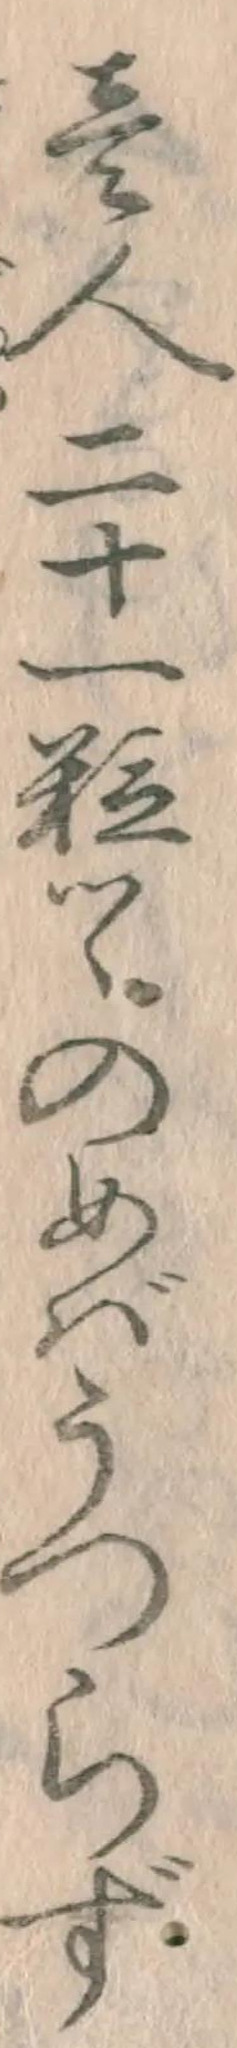壱人二十一粒ツヽのめばうつらず
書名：きゝん年の食物
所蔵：国立国会図書館 National Diet Library, JAPAN
